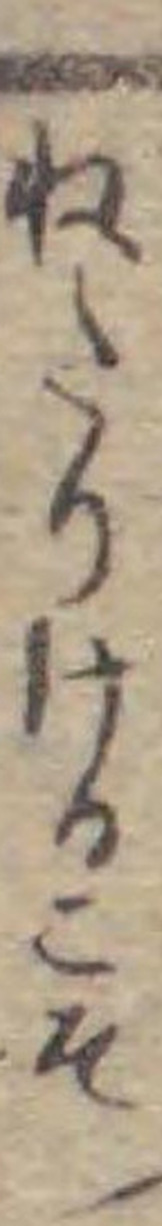ねたりけるこそ
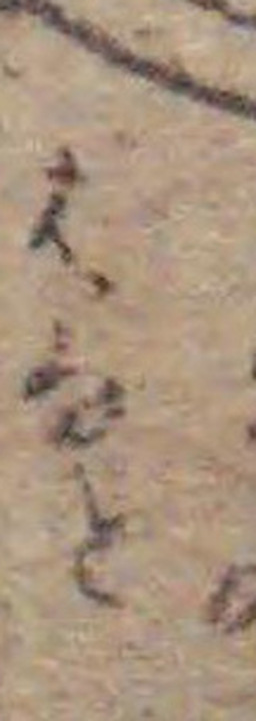はなと

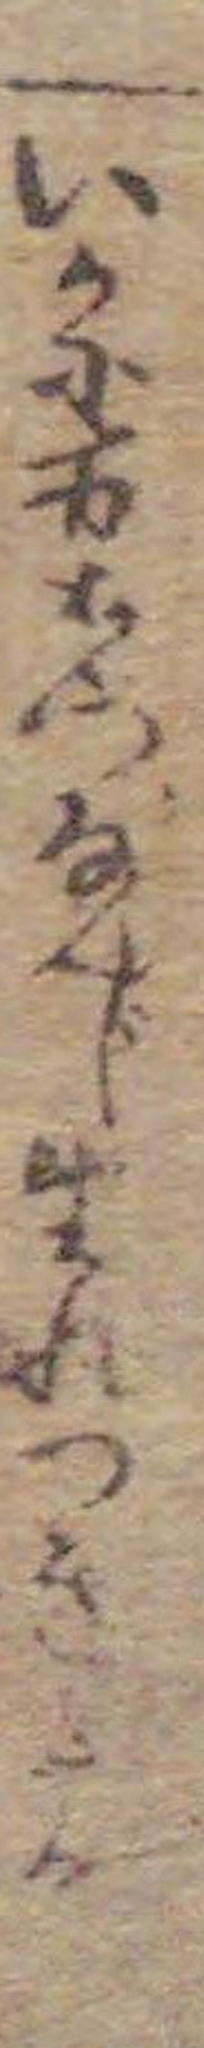いかに万右衛門なんじ生まれつきたる
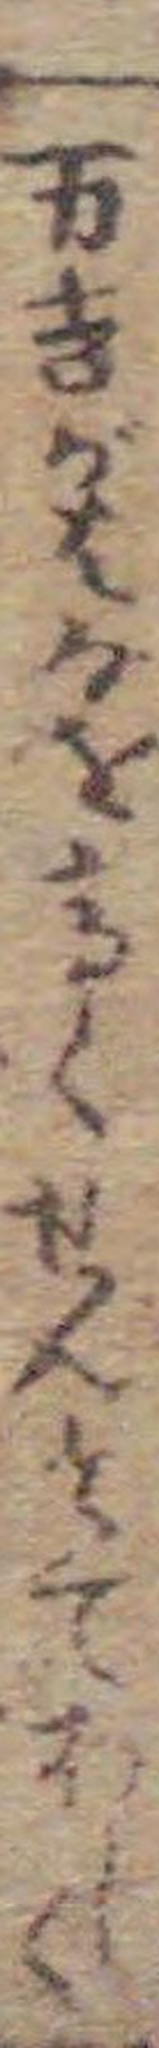万吉がはなを高くせんとてあしく
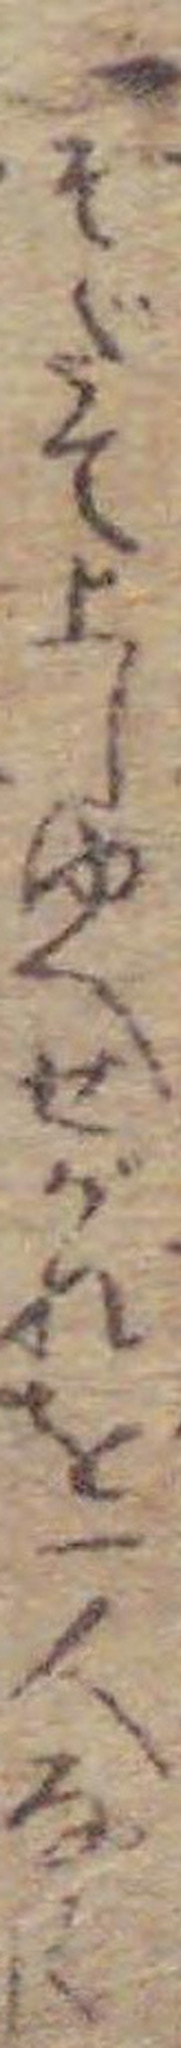そだて上しゆへせがれを一人なくし
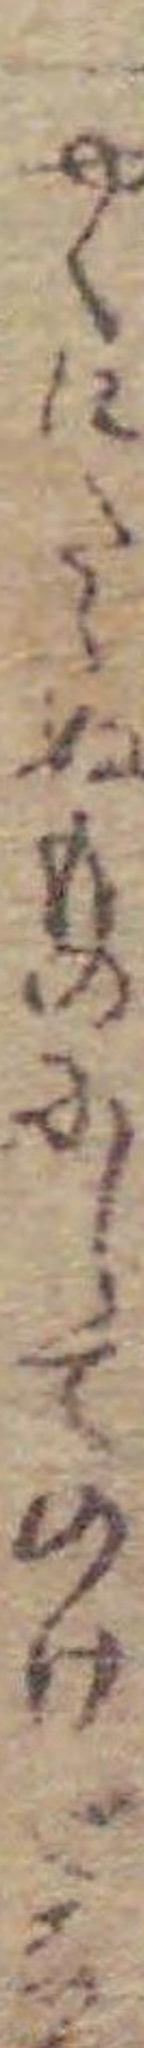やくにたゝぬものにしてのけたなり
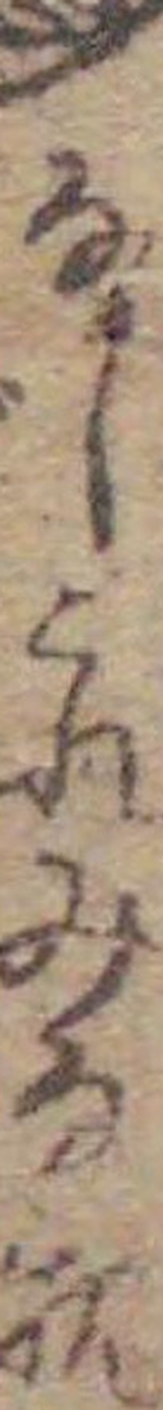なしこれみな親か
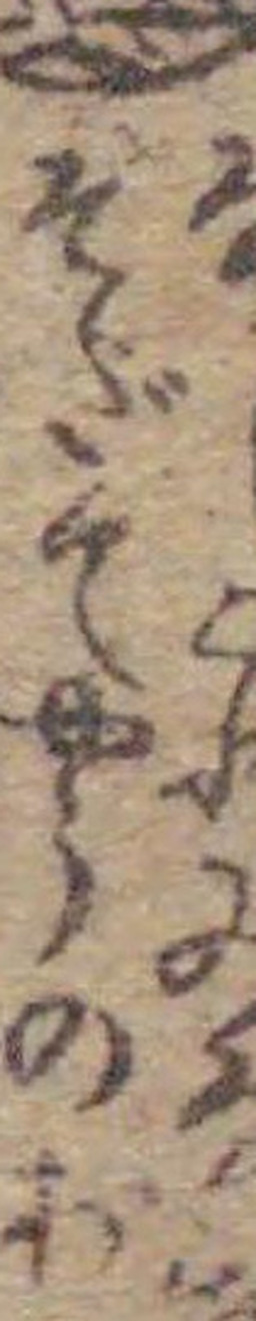そだてやうのあし
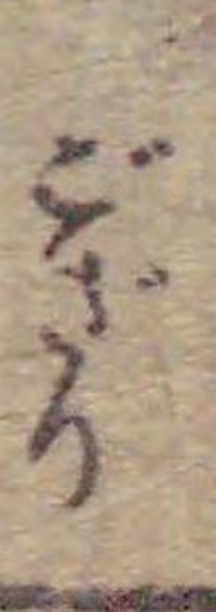ござり
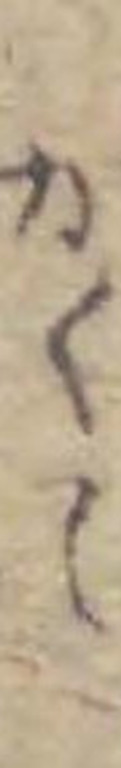かくて
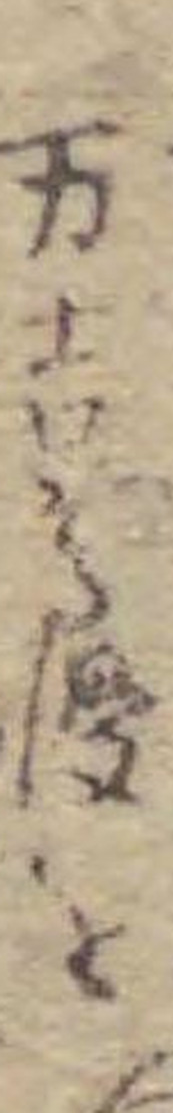万吉高慢を
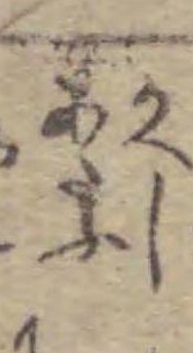あたふ
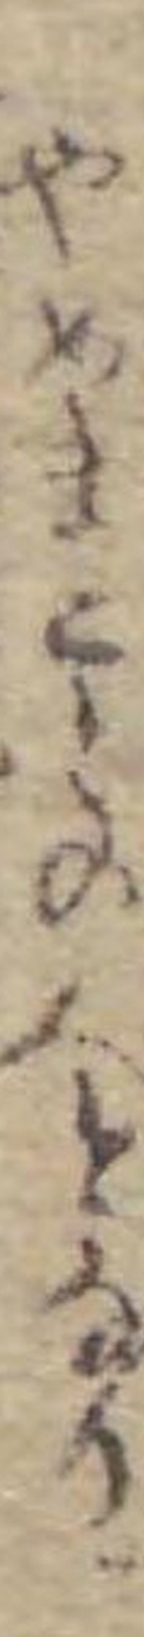やめまことの人となり
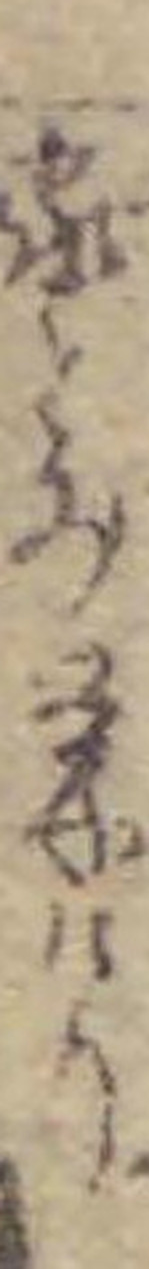家とみ栄けり
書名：鼻峰高慢男 : 2巻
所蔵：国立国会図書館 National Diet Library, JAPAN
